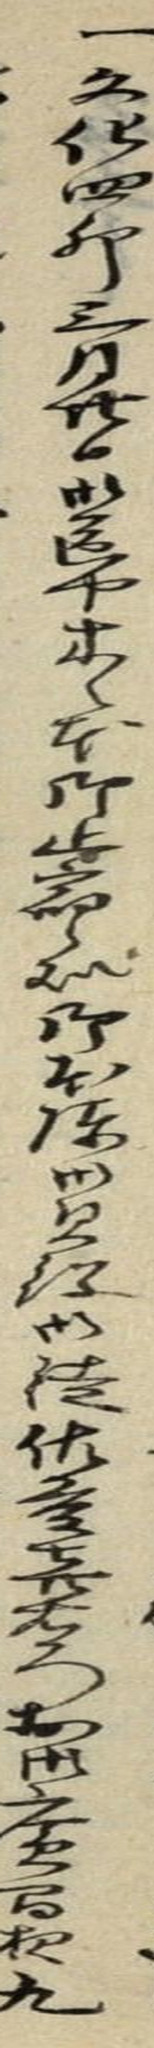一文化四卯三月廿日御道中木之本御止宿之処御本陣御貝役御徒佐藤喜右衛門於御広間夜九
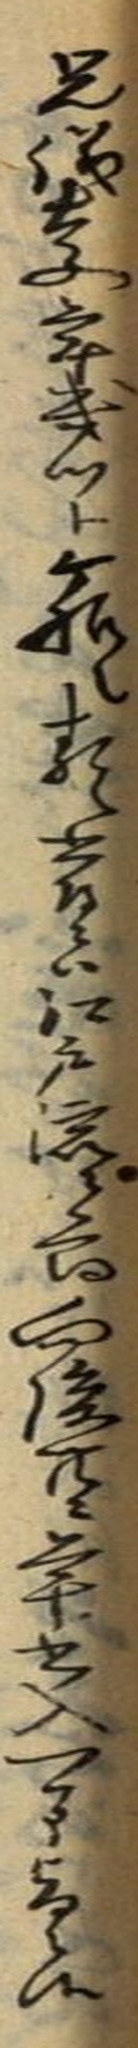兄儀大夫年幾ツトケ様之類之書付には江戸流に候間向後共に年書入可申旨に候
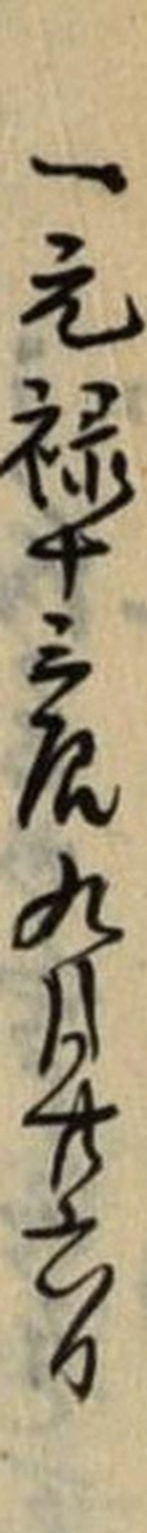一元禄十三辰九月廿六日
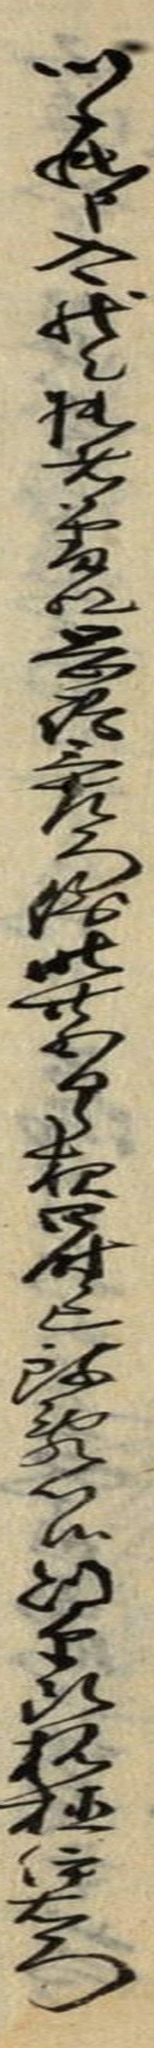以手紙申入候然は拙者御番組岡島三左衛門儀昨廿五日夜四時過致乱心候則筆頭柘植伊右衛門
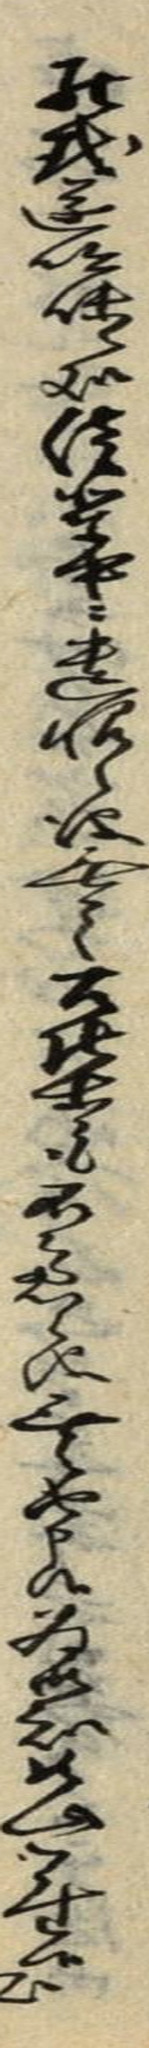罷越遂吟味候処傍輩中に遺恨之儀無之召仕等にも不慮之儀無之由申候為御知如此御座候以上
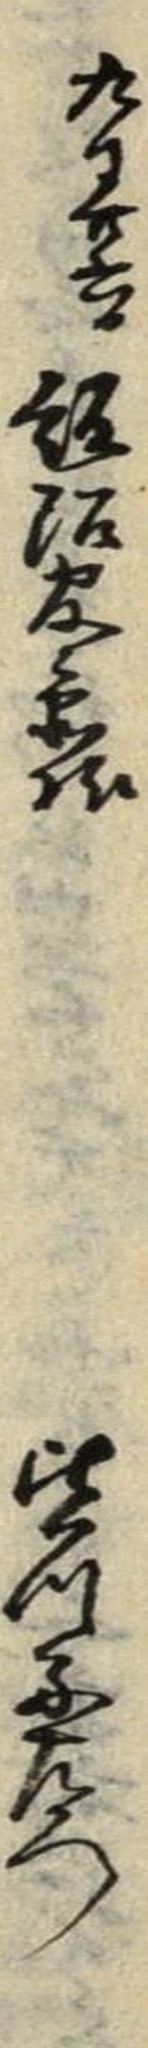九月廿六日飯沼官兵衛様皆川多左衛門
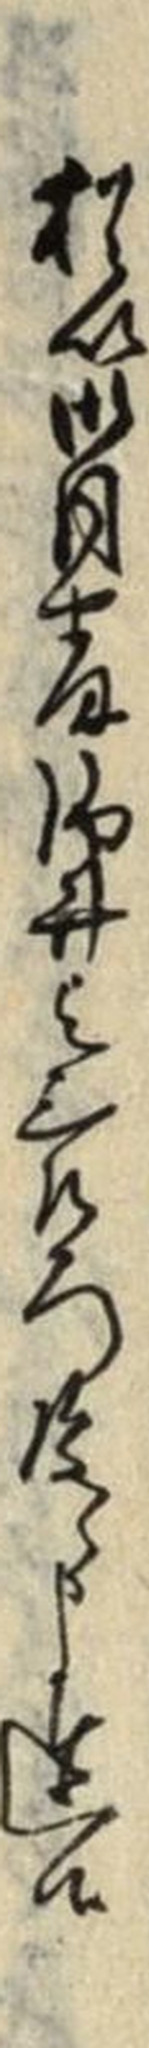猶以御月番酒井与三左衛門殿へ申達候
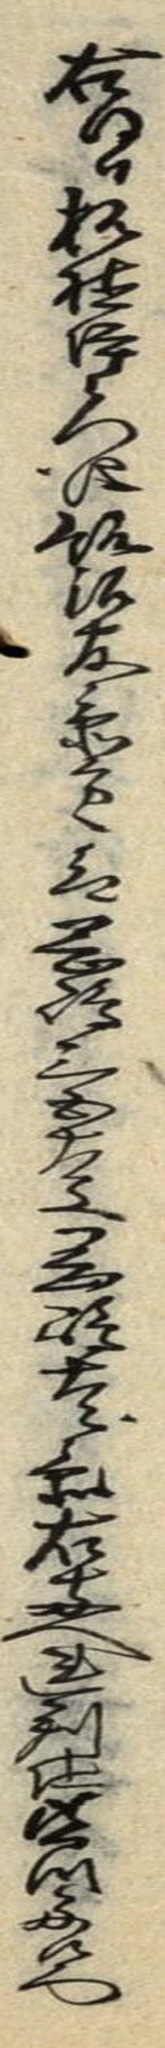右同日柘植伊右衛門儀飯沼官兵衛方へ参岡島三五大夫岡島太郎兵衛右両人連判仕皆川多左衛門
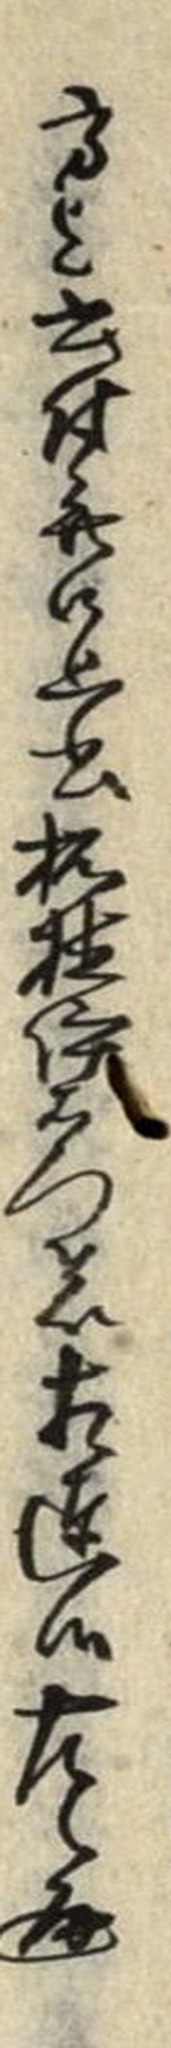方迄書付并口上書柘植伊右衛門を以相達候左之通
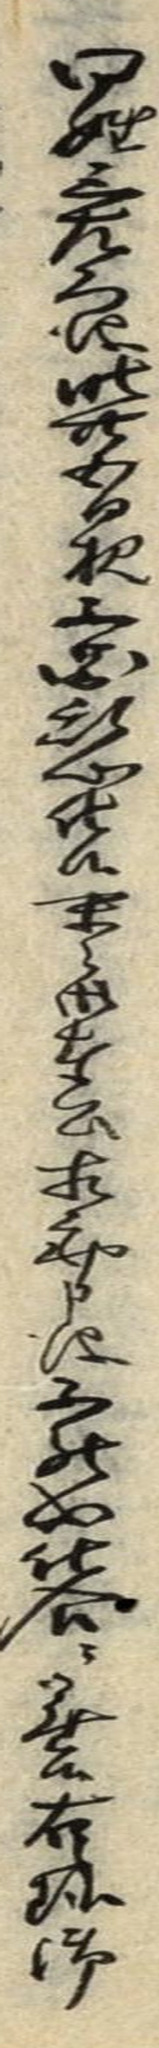同姓三左衛門儀昨廿五日夜不図乱心仕候末々御奉公相勤申儀不罷成仕合に御座候右之趣御
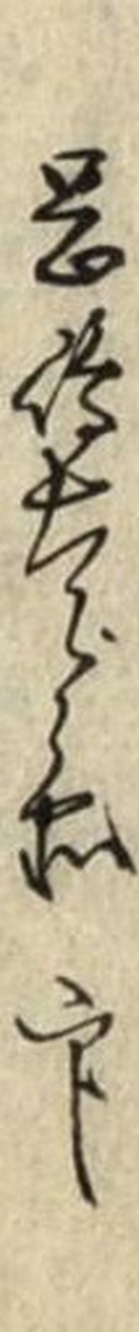岡島太郎兵衛
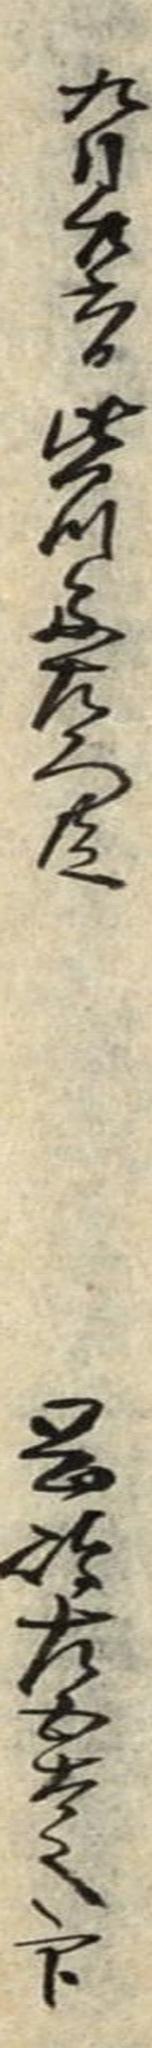九月廿六日皆川多左衛門殿岡島左五大夫印
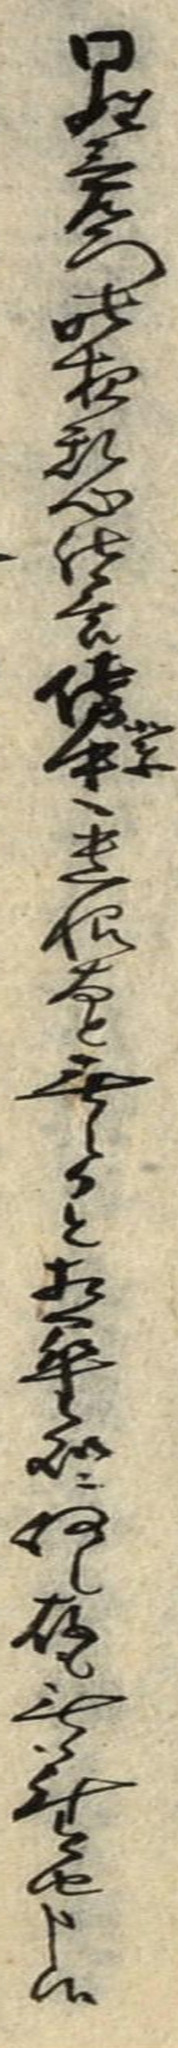同姓三左衛門儀昨夜乱心仕候節傍輩中へ遺恨なと無之かと相尋候処に何之存も無御座候由申候
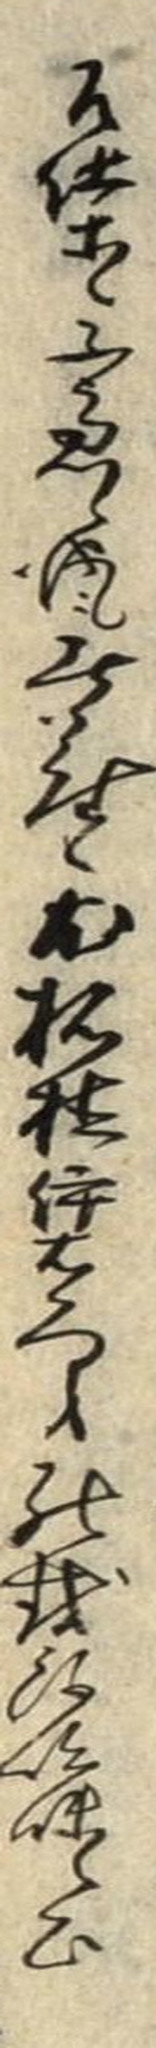召仕等へ不慮之儀も無御座候尤柘植伊右衛門方罷越致吟味候以上
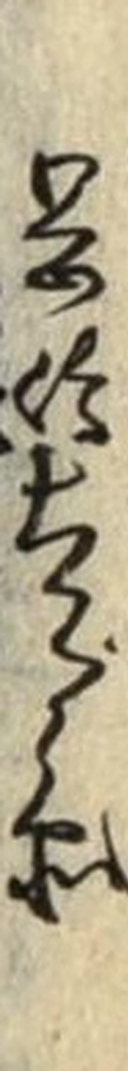岡島太郎兵衛
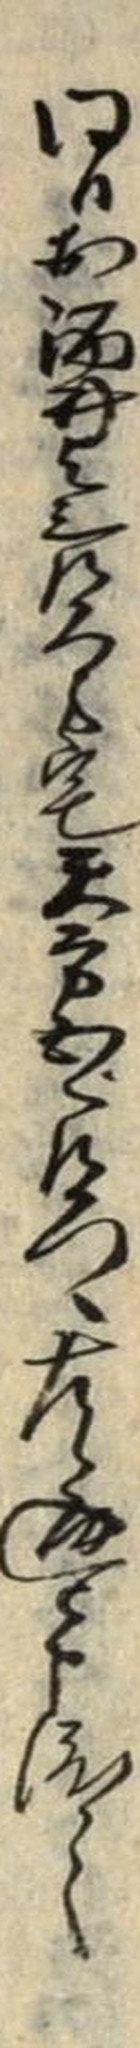同日於酒井与三左衛門方宅天方五郎左衛門へ左之通被申渡之
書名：御停止異変死失
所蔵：福井県文書館 Fukui Prefectural Archives
